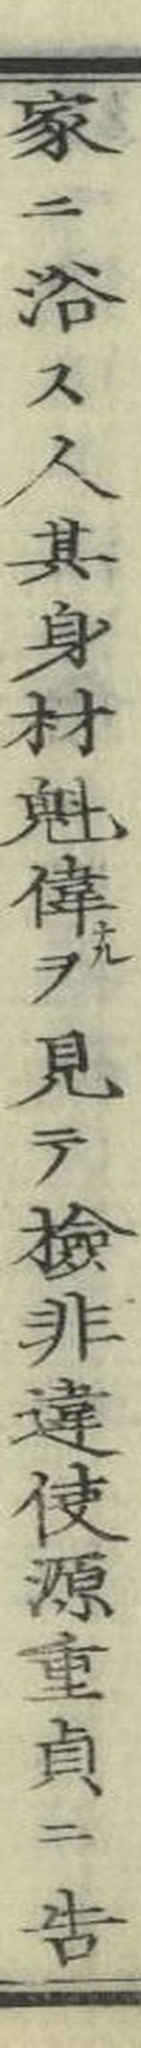家ニ浴ス人其身材魁偉ヲ見テ檢非違使源重貞ニ告
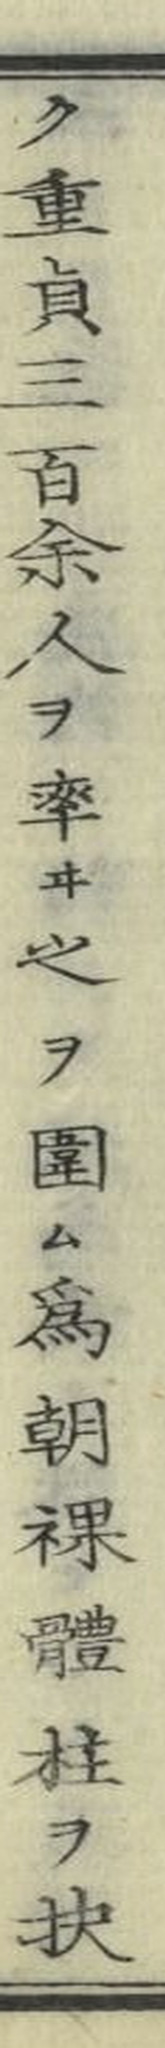ク重貞三百余人ヲ率ヰ之ヲ圍ム爲朝裸體柱ヲ抉
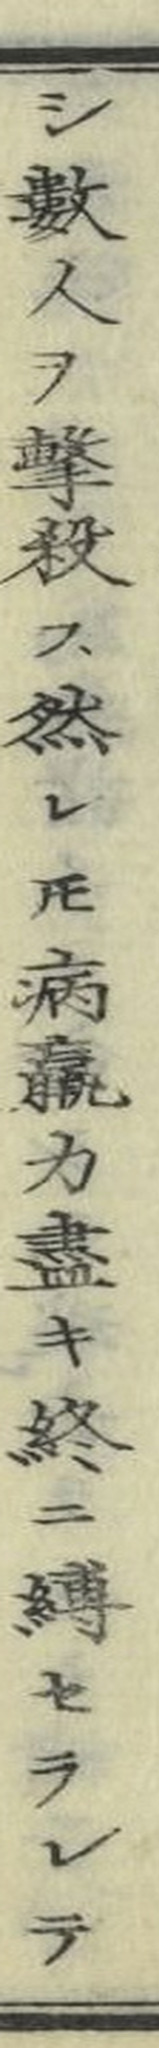シ數人ヲ撃殺ス然レトモ病嬴力盡キ終ニ縛セラレテ
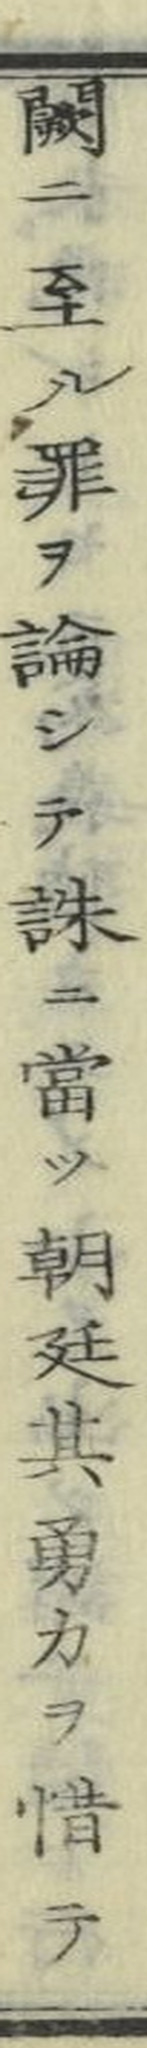闕ニ至ル罪ヲ論シテ誅ニ當ツ朝廷其勇力ヲ惜テ
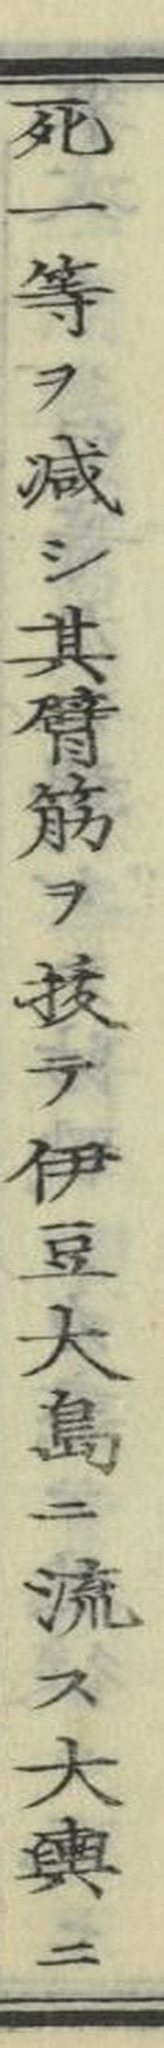死一等ヲ減シ其臂筋ヲ拔テ伊豆大島ニ流ス大輿ニ
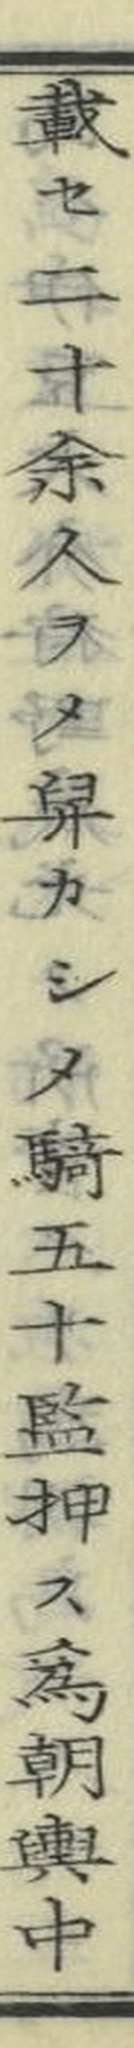載セ二十余人ヲシテ舁カシメ騎五十監押ス爲朝輿中
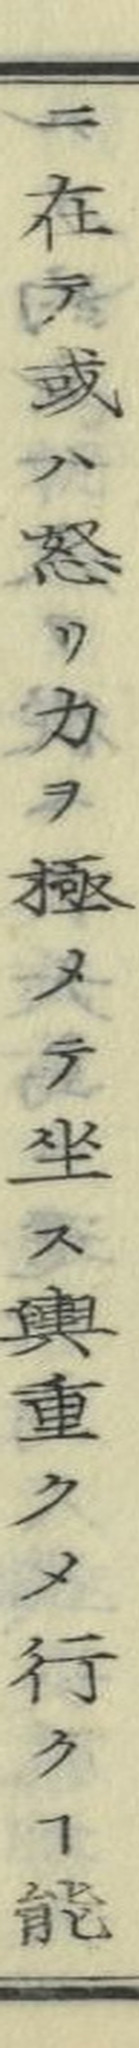ニ在テ或ハ怒リ力ヲ極メテ坐ス輿重クシテ行クコト能
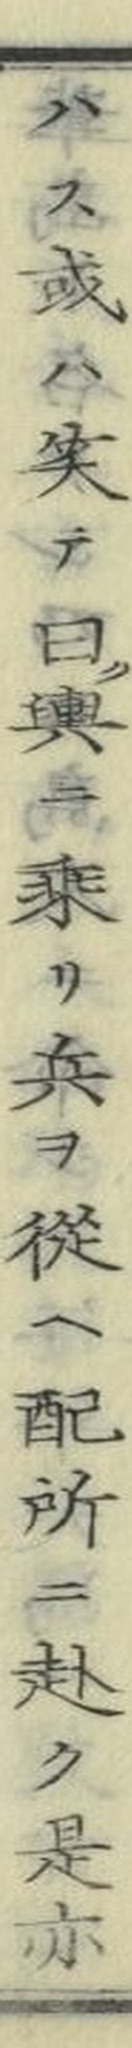ハス或ハ笑テ曰輿ニ乘リ兵ヲ從ヘ配所ニ赴ク是亦
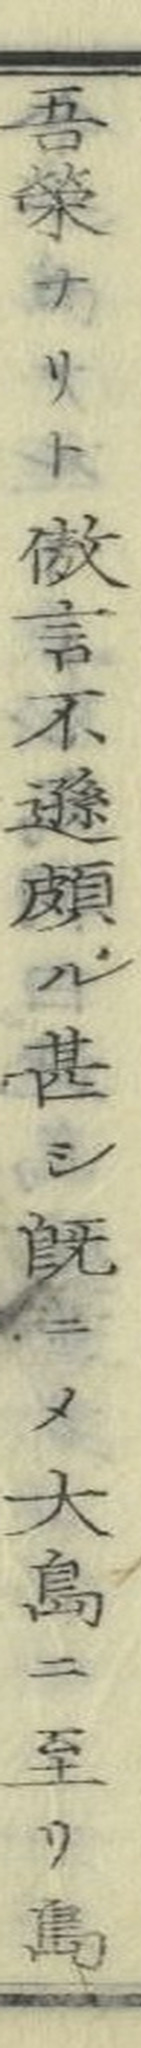吾榮ナリト傲言不遜頗ル甚シ既ニシテ大島ニ至リ島
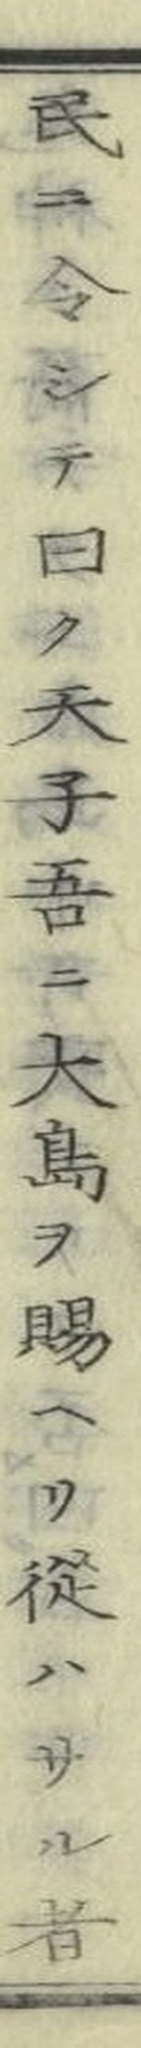民ニ令シテ曰ク天子吾ニ大島ヲ賜ヘリ從ハサル者
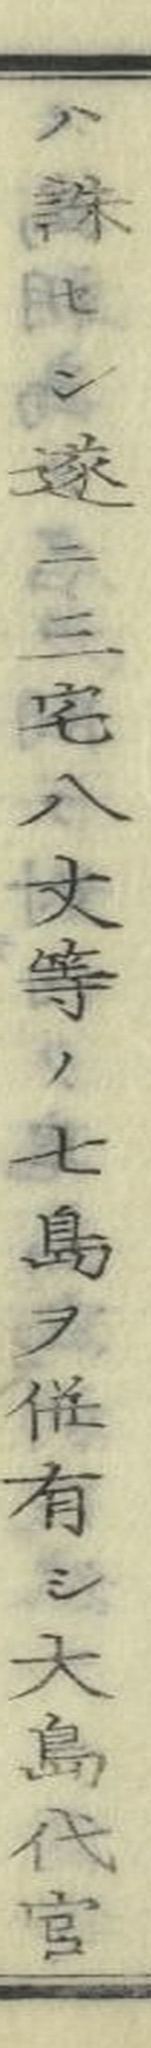ハ誅ヒン遂ニ三宅八丈等ノ七島ヲ併有シ大島代官
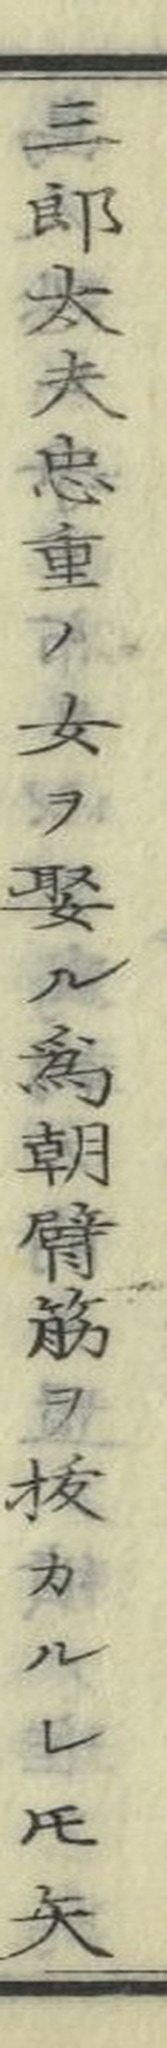三郎太夫忠重ノ女ヲ娶ル爲朝臂筋ヲ拔カルレトモ矢
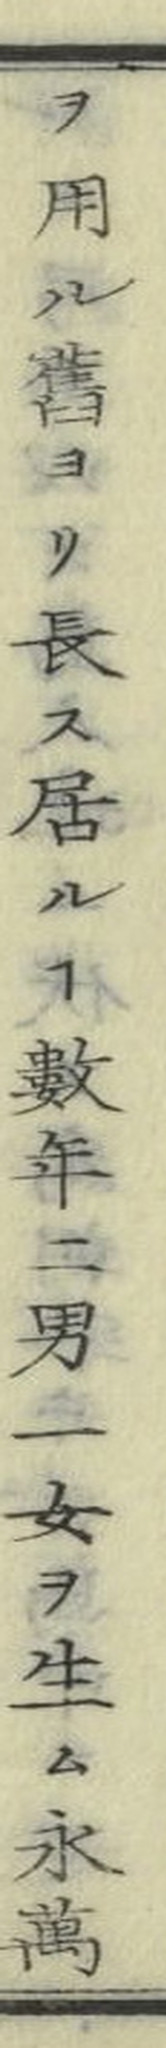ヲ用ル舊ヨリ長ス居ルコト數年二男一女ヲ生ム永萬
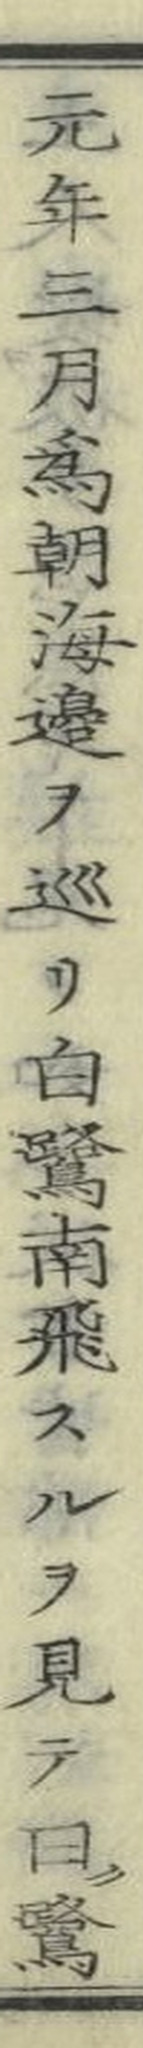元年三月爲朝海邊ヲ巡リ白鷺南飛スルヲ見テ曰鷺
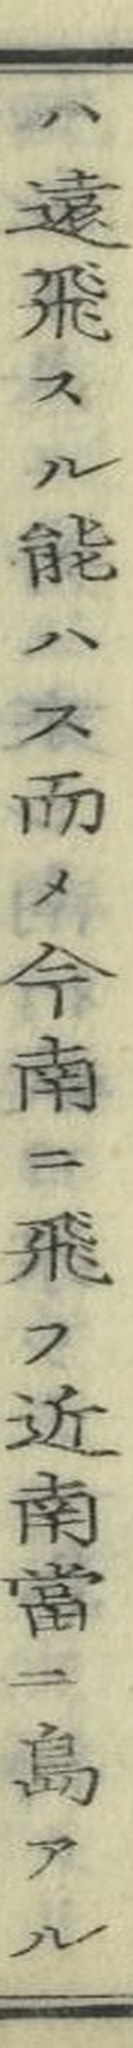ハ遠飛スル能ハス而シテ今南ニ飛フ近南當ニ島アル

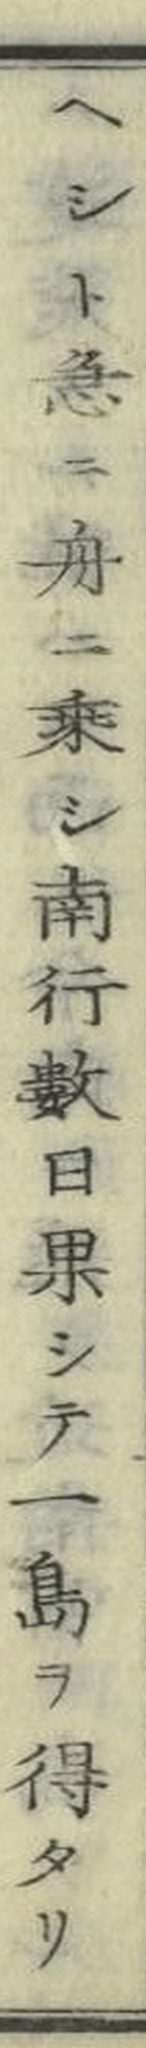ヘシト急ニ舟ニ乗シ南行數日果シテ一島ヲ得タリ
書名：琉球藩史 一之巻
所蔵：University of the Ryukyus Library
